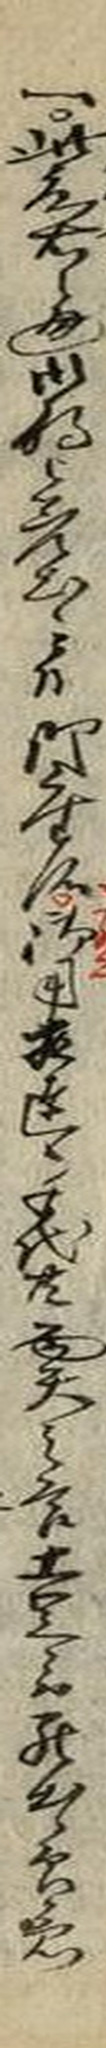一此度右之通御触被差出候に付御座所へ罷出御用相達候手代共雨天之節土足に而罷出候而は急
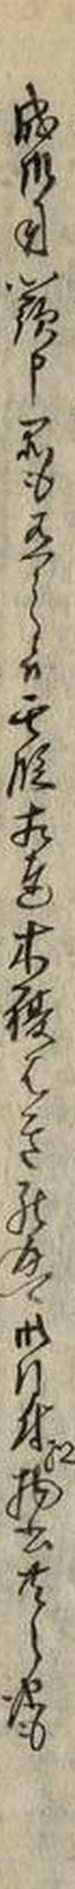成御用御預申品も有之候に付其段相達木履はき罷通候御目付組物書共之儀も
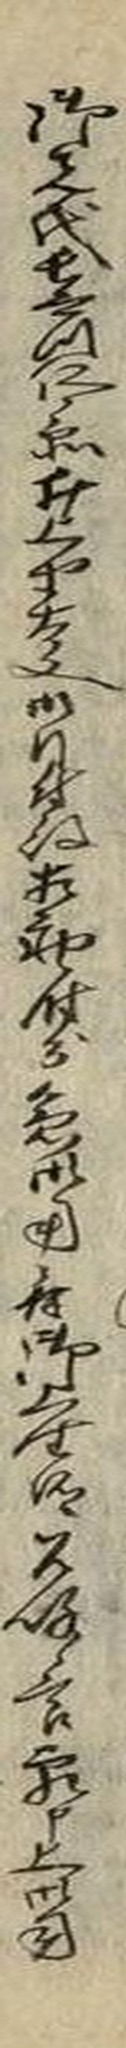御先代長谷川仁兵衛井上半太夫御目付役相勤候時分急御用に付御座所へ召呼候節願申上御用
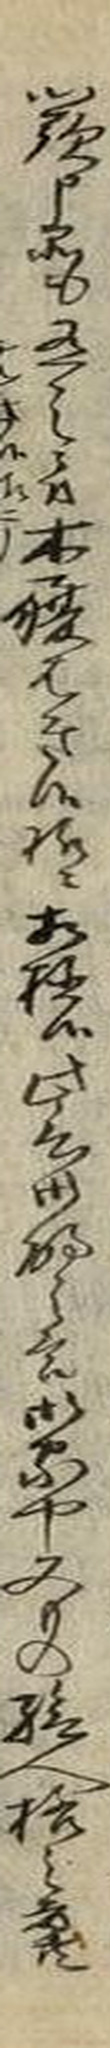御預申品も有之候付木履はき候様に相極候此度御触之節御家中又もの給人格之者共
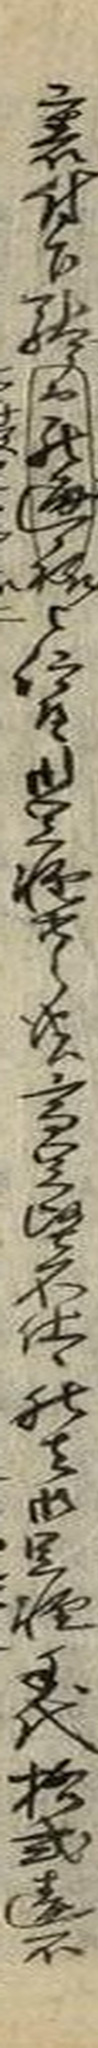裏付下駄はき候様ニ被仰付候御足軽共之儀は高足堅不仕候然は御足軽手代格式違不
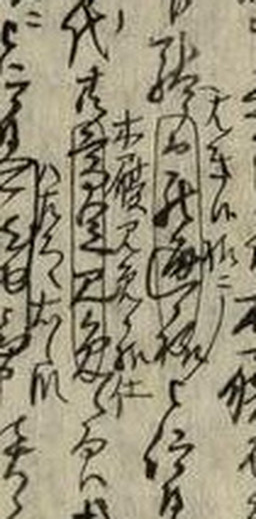木履見免候様仕
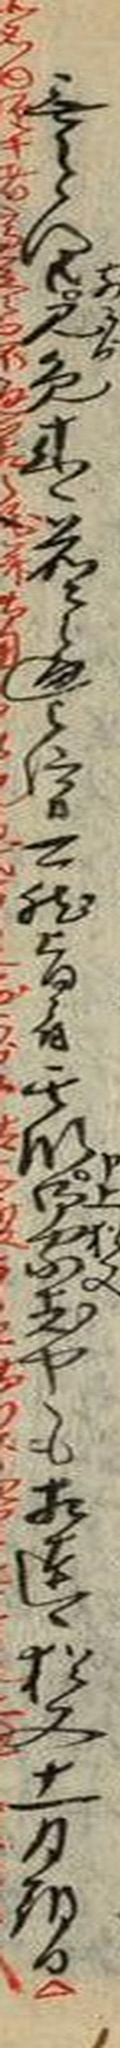無之候得共前々ゟ見免来候前々之通被仰付可然旨に付其段申上猶又御家老中へも相達候猶又十一月朔日△
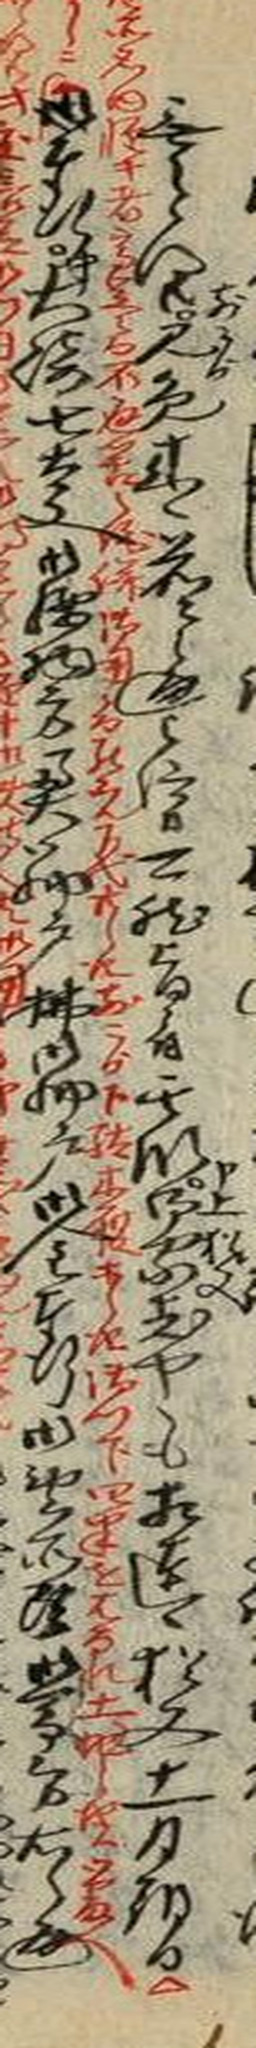御奉行中大崎七太夫御腰物方奥御納戸払御納戸御金奉行御台所頭御馬方右之通
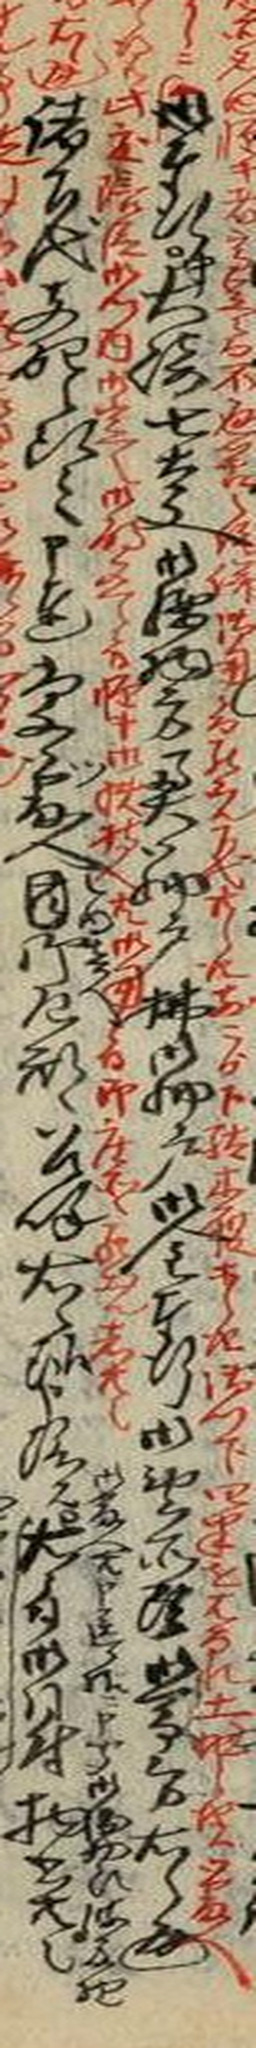諸下代支配之頭々へ申達尚又△御番人共之内壱人御屋形へ召呼右之趣申渡ス○右に付御目付物書共之
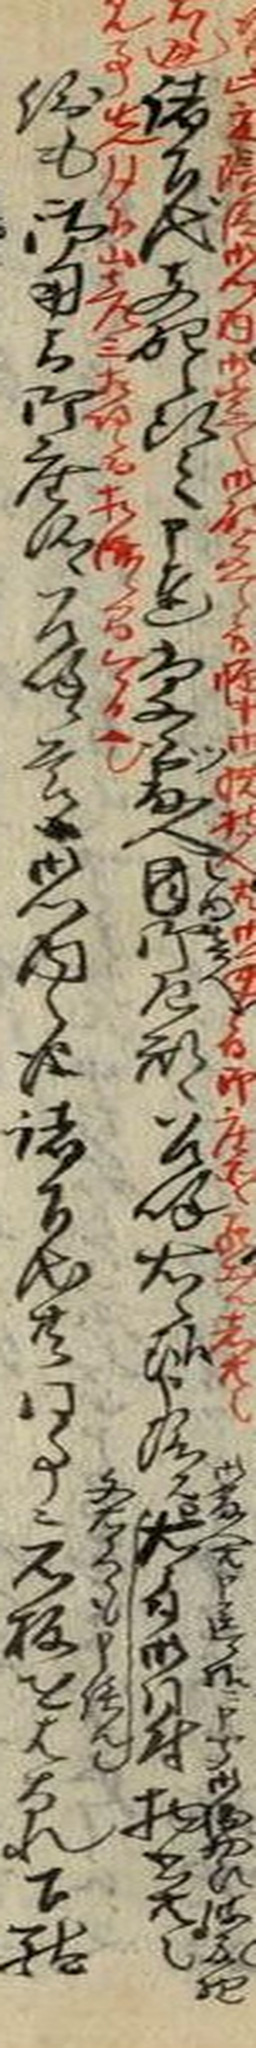儀も御用に而御座所へ召呼候節御門内之儀諸下代共同事に石板をはなれ下駄
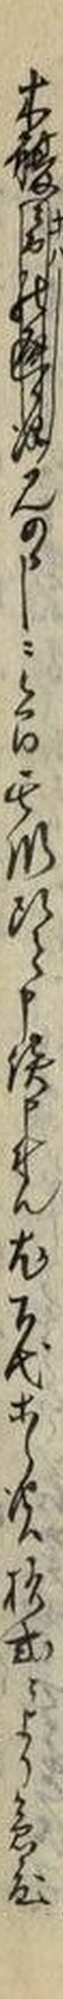木履に而罷通候儀見のかしに候間其段頭々へ申談申付ル尤下代等之儀は格式により急度
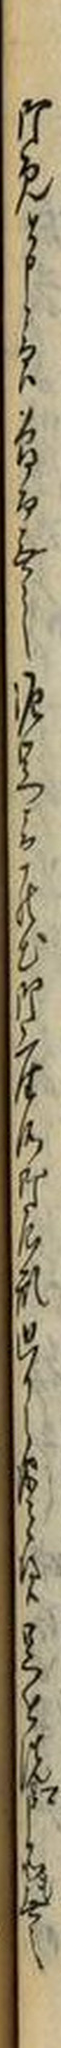御免被申候而は曽而無之泥足に而罷出御座所御屋形廻り之儀に候得は足を洗可申所も無之
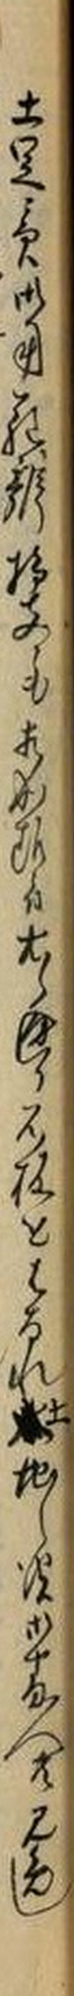土足に而は御用難弁指支にも相成候趣に付右之通石板をはなれ土地之儀御番人共見免し
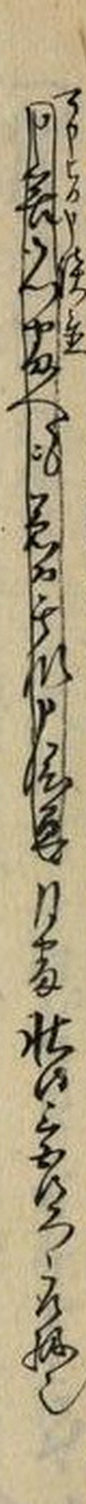申筈御門番人とも兼而其段申渡置候月番秋田三五左衛門取扱也
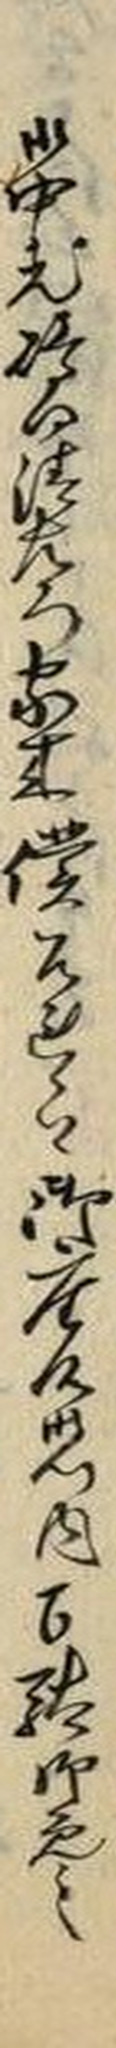一御中老嶋田清左衛門家来僕召連候はゝ御座所御門内下駄御免之
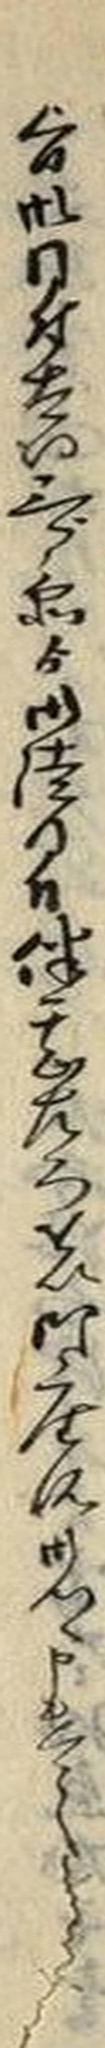旨御目付太田三郎兵衛ゟ御徒目付伴甚左衛門を以御座所御門へ申遣之
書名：御門御櫓之部
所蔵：福井県文書館 Fukui Prefectural Archives
